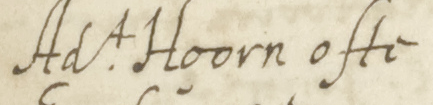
Adt. Hoorn ofte
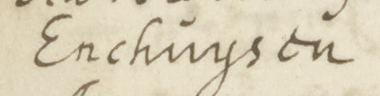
Enchuysen
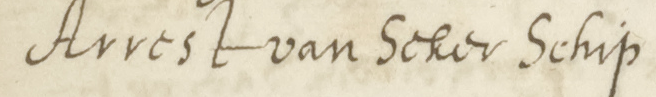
Arrest van seker Schip
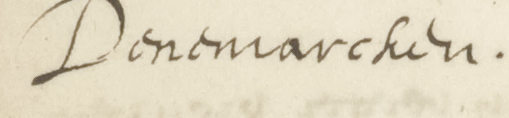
Denemarcken.
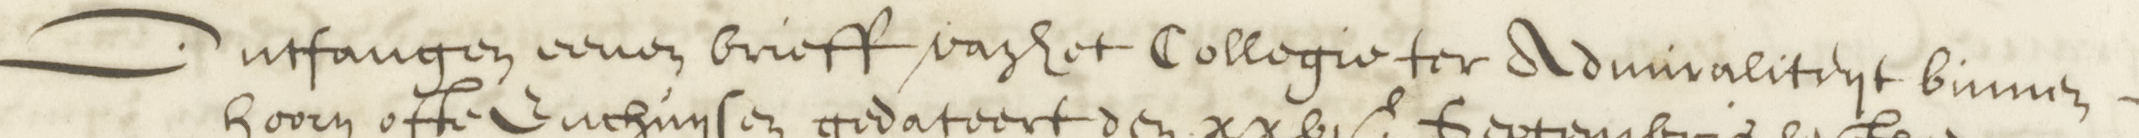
Ontfangen eenen brieff van het Collegie ter Admiraliteyt binnen
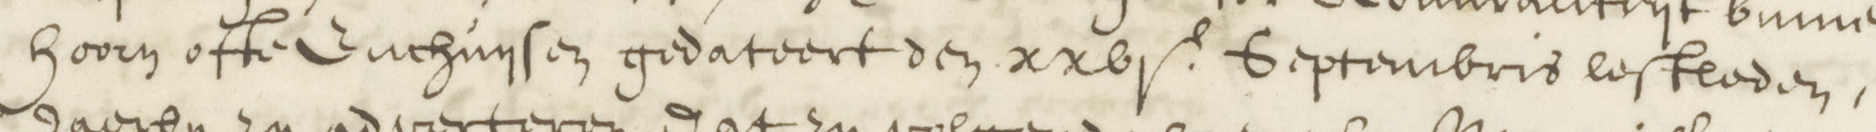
hoorn ofte Enchuysen gedateert den xxvje. Septembris lestleden,
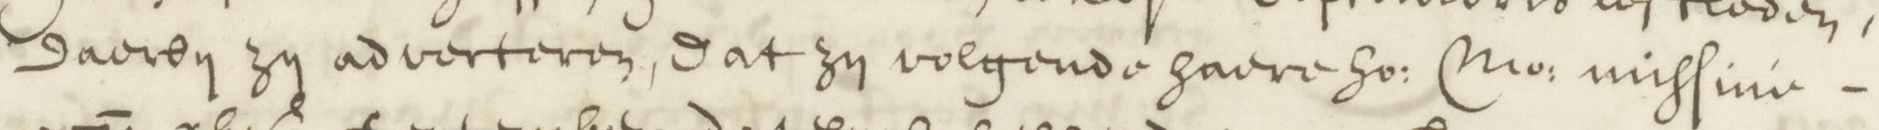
Daerby zy adverteren, dat zy volgende haere ho:Mo: missive -
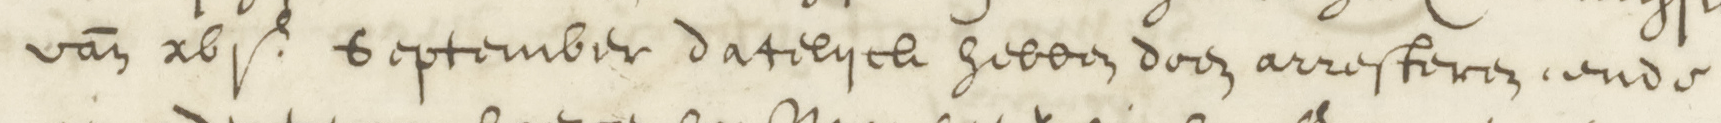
van xvje. september datelyck hebben doen arresteren, ende
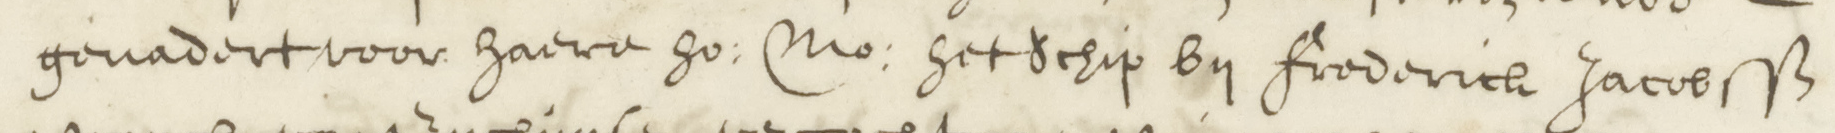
genadert voor haere ho:Mo: het Schip by Frederick Jacobsz
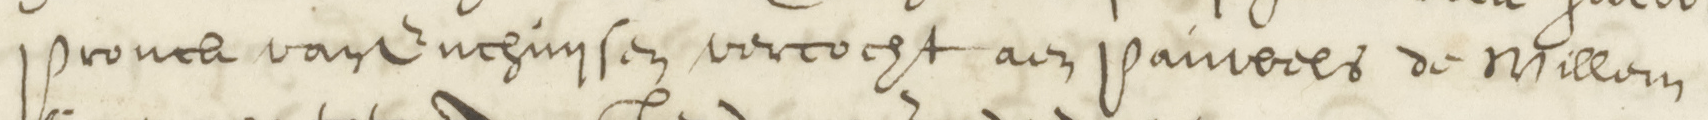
Pronck van Enchuysen vercocht aen Pauwels de Willem
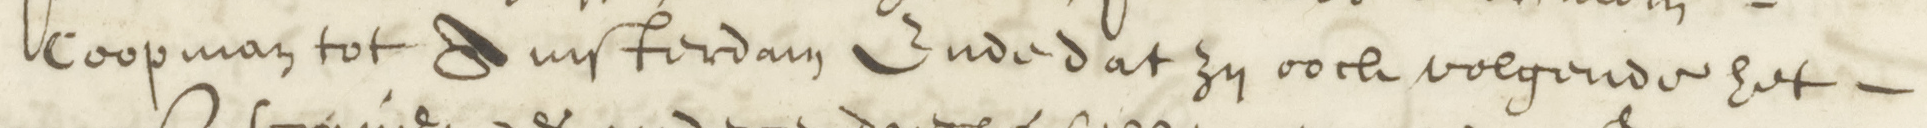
Coopman tot Amsterdam Ende dat zy oock volgende het —
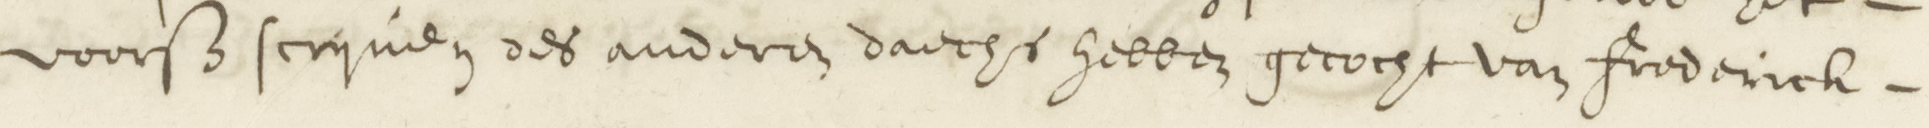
voorsz scrijuen des anderen daechs hebben gecocht van Frederick —
